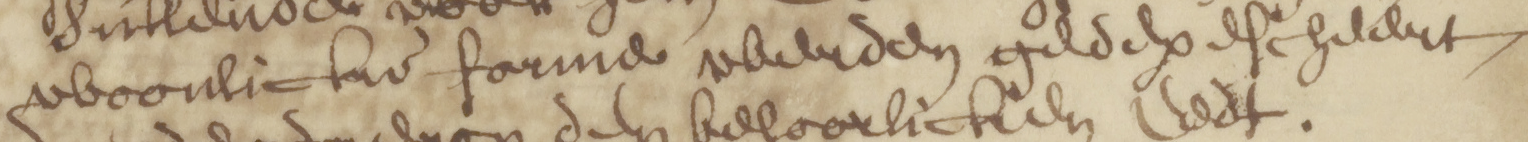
woonlicke forme werden gedepescheert,
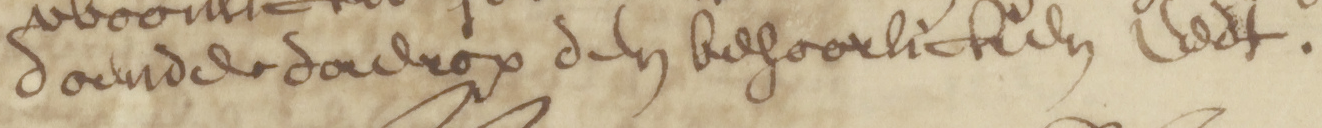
doende daerop den behoorlicken Eedt.
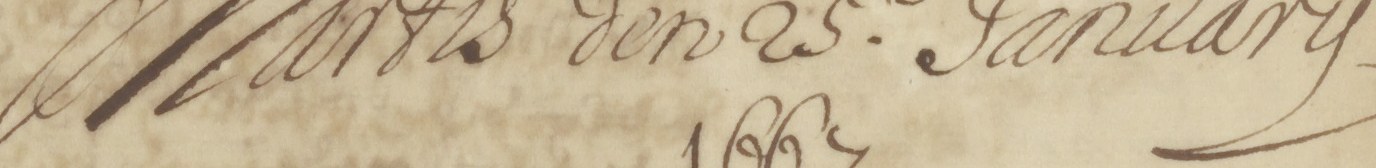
Martis den 25en. January
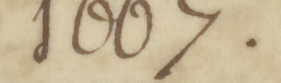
1667.
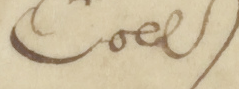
Coll
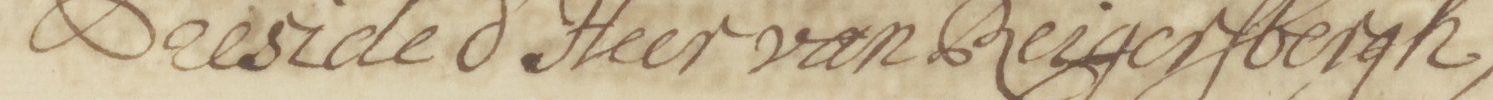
Preside d' Heer van Reigersbergh
